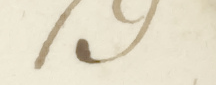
79
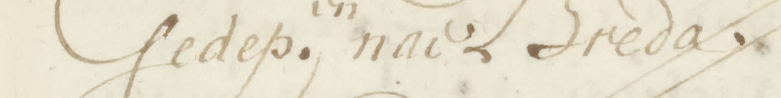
Gedepen. nae Breda.
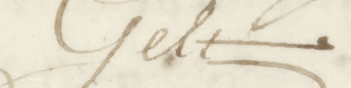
Gelt
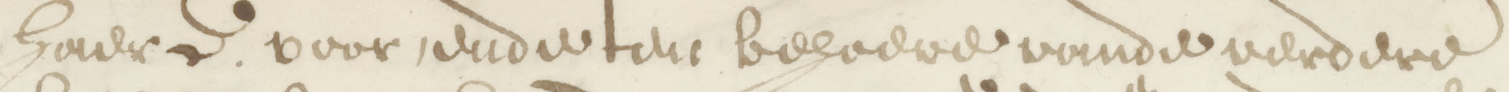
haer E. voor, ende ter behoeve vande verdere
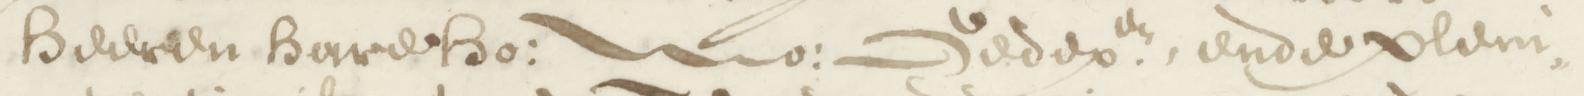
heeren hare Ho:Mo: Gedepen., ende pleni,,
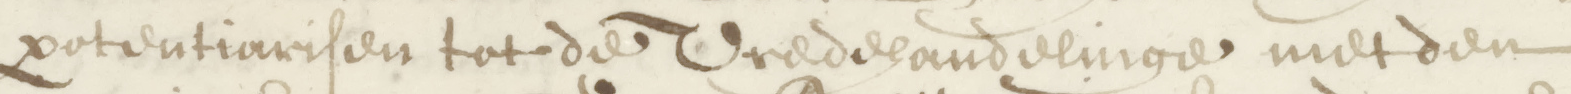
potentiarisen tot de Vredehandelinge met den
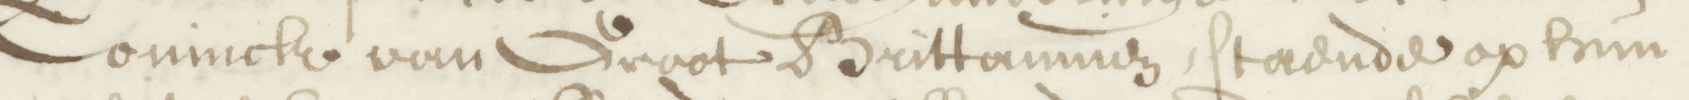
Coninck van Groot Brittannien, staende op hun
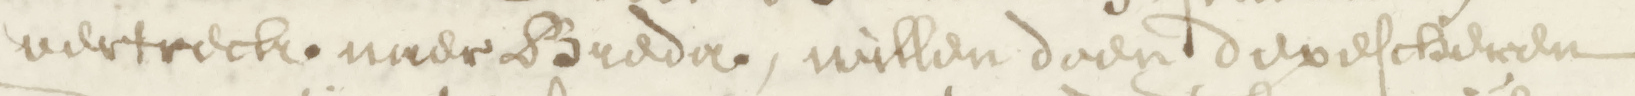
vertreck naer Breda, willen doen depescheren
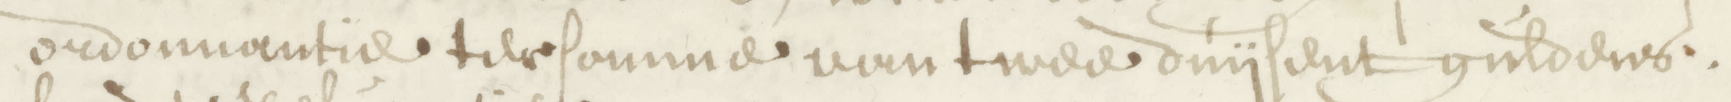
ordonnantie ter somme van twee duijsent guldens,
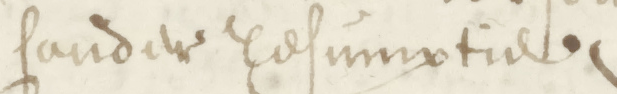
sonder resumptie.
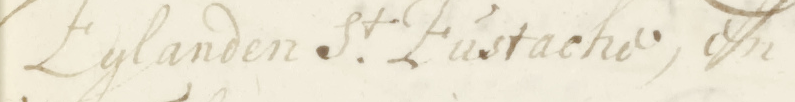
Eylanden St. Eustache, en
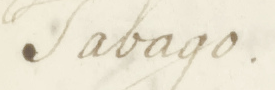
Tabago.
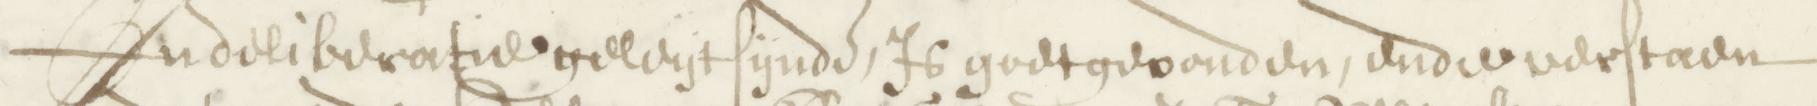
In deliberatie geleijt sijnde, Is goetgevonden, ende verstaen
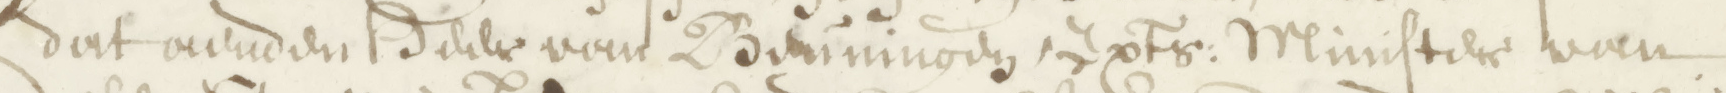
dat aenden Heer van Beuningen Exts: Minister van
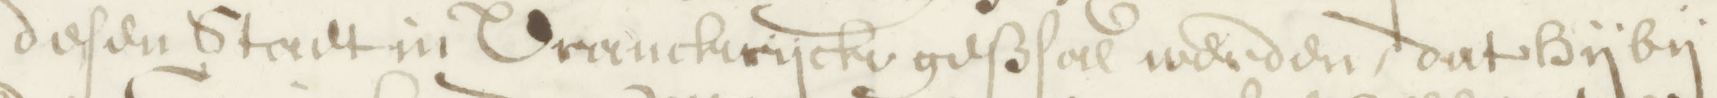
desen Staet in Vranckrijck ges sal werden, dat hij bij
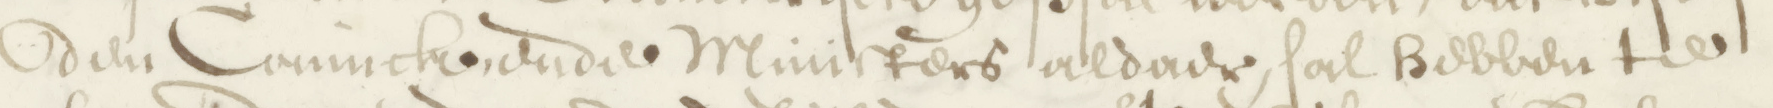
den Coninck, ende Ministers aldaer, sal hebben te
